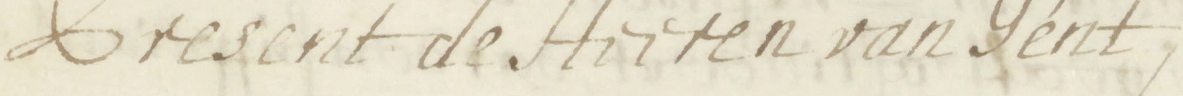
Present de Heeren van Gent,
